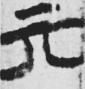亓（其）
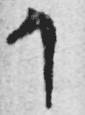人
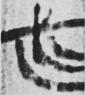必
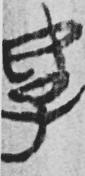好
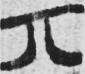亓（其）
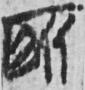所
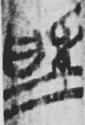爲
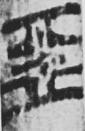亞（惡）
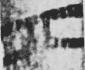亓（其）
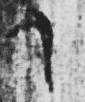人
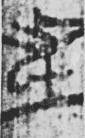者
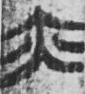亦
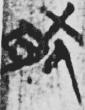肰（然）
